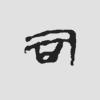司
